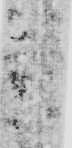甚
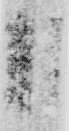難（歎）
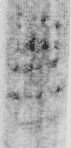思
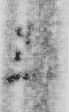之
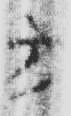方
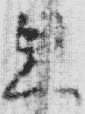也
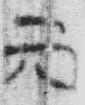亓（其）
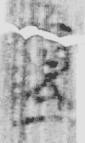聖（聲）
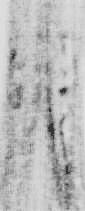弁（變）
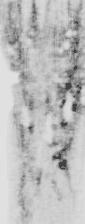鼎（則）
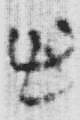心
